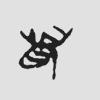舄
